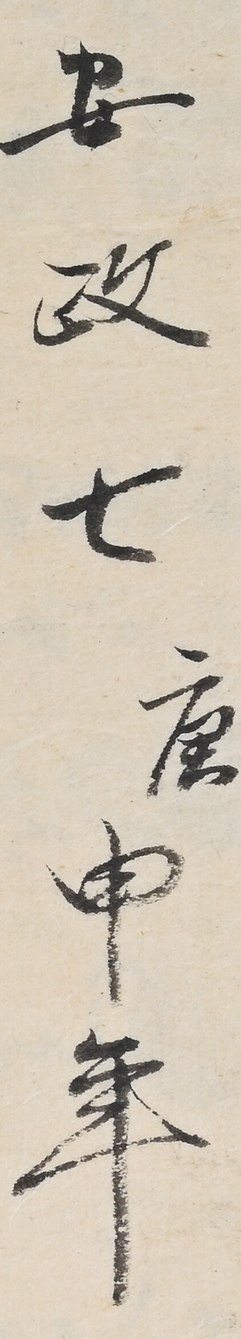㊞安政七庚申年
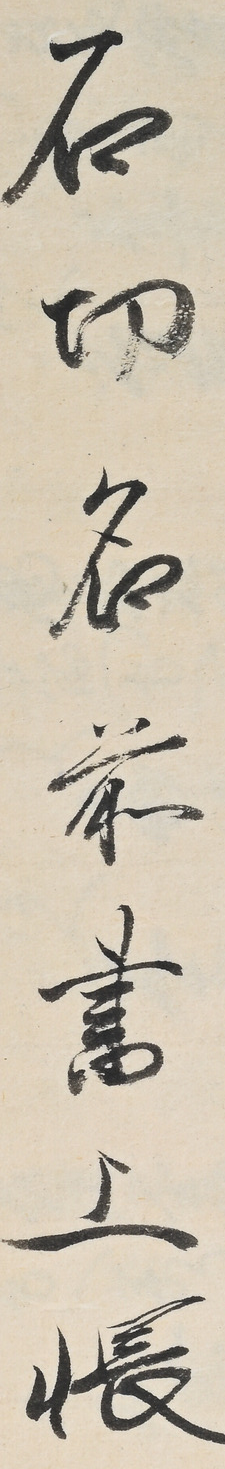石切名前書上帳
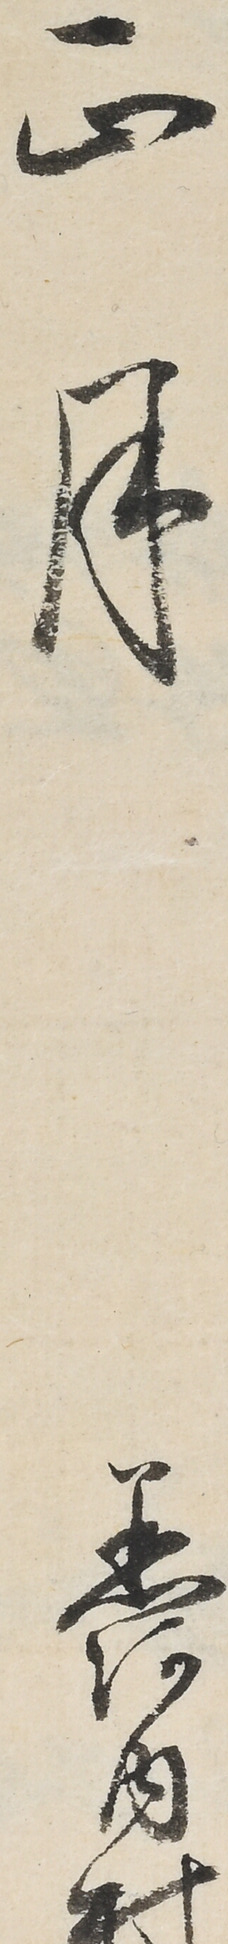㊞正月黒河内村

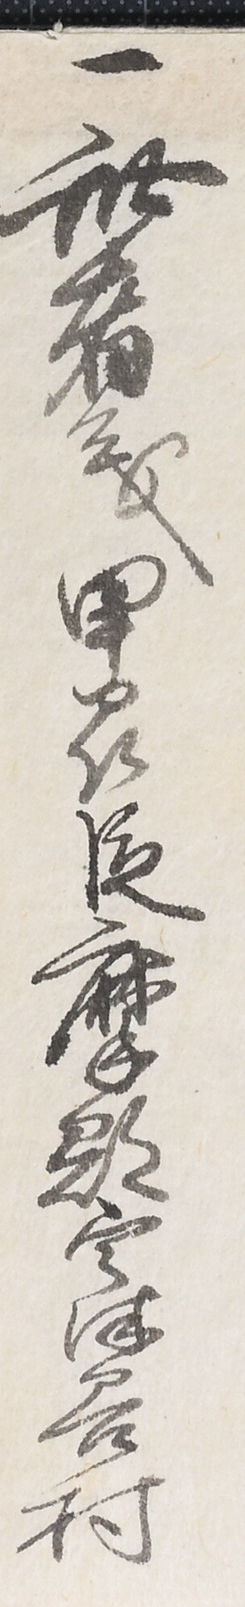一此者義甲州巨摩郡宇津谷村
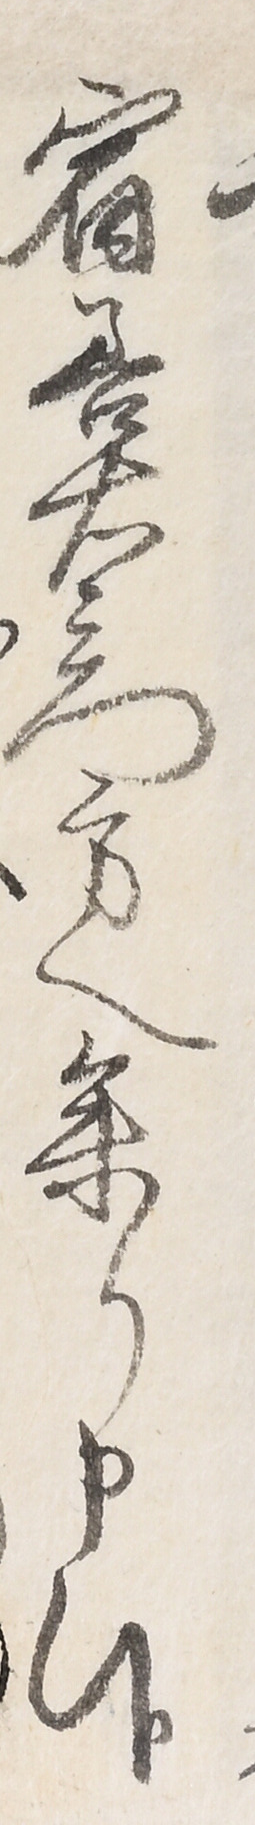宿善右衛門方へ参り申候
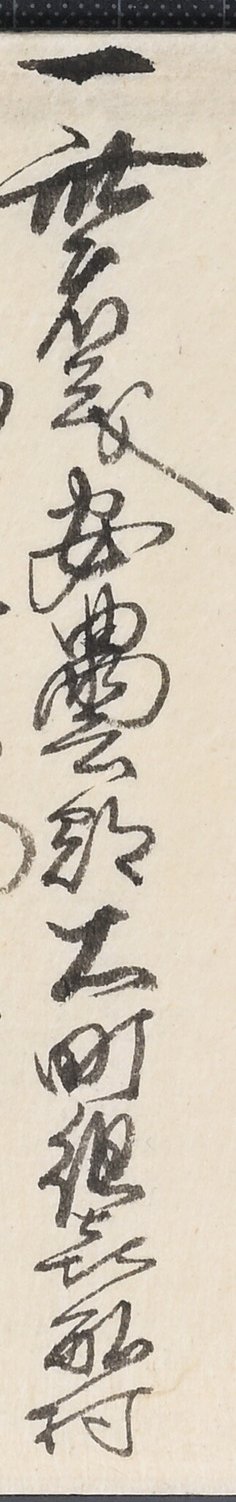一此者義安曇郡大町組喜船村
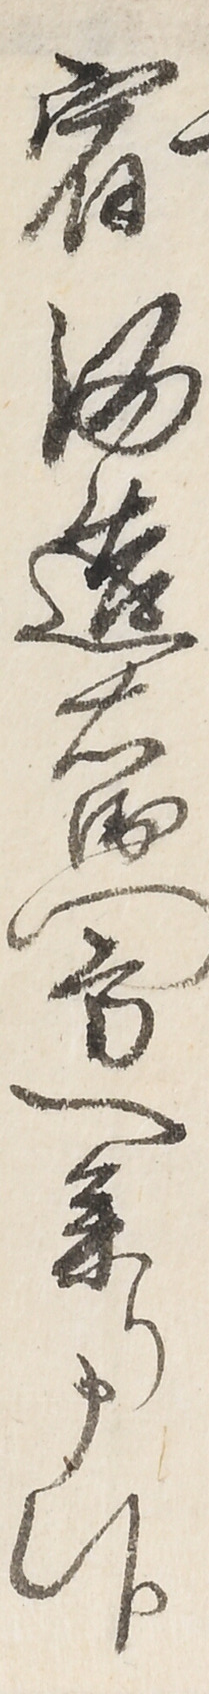宿酒造右衛門方へ参り申候
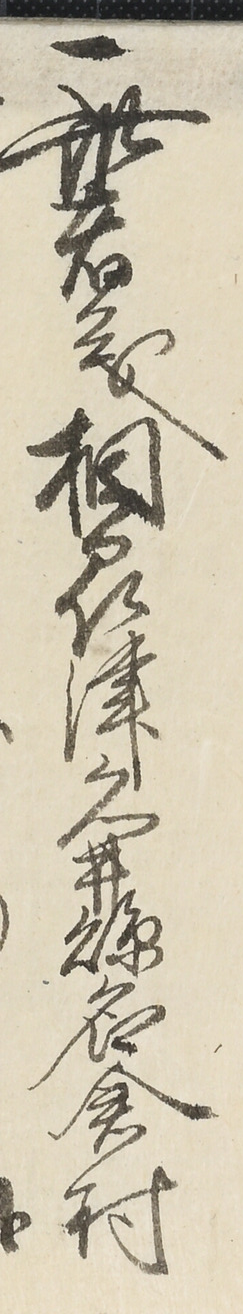一此者義相州津久井県名倉村
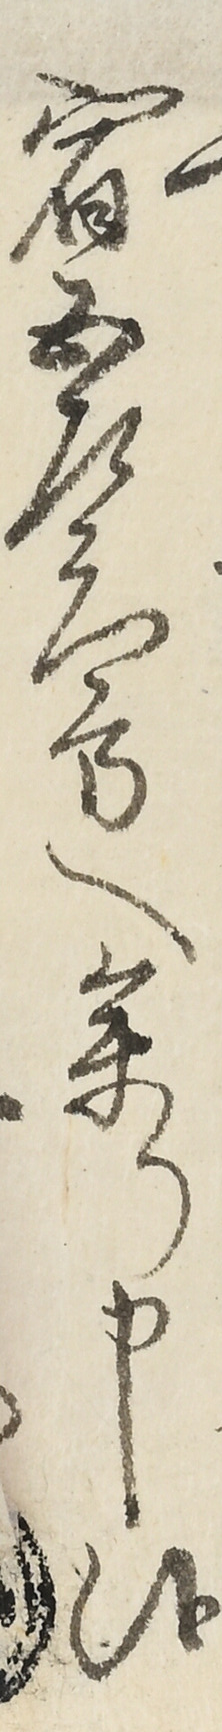宿五左衛門方へ参り申候

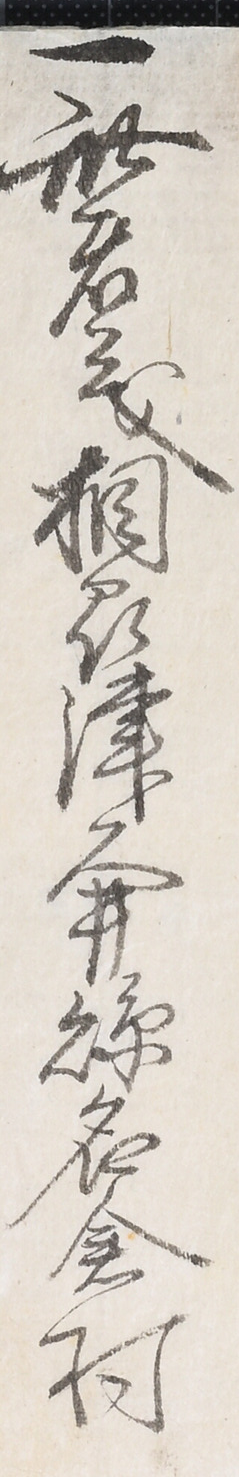一此者義相州津久井県名倉村
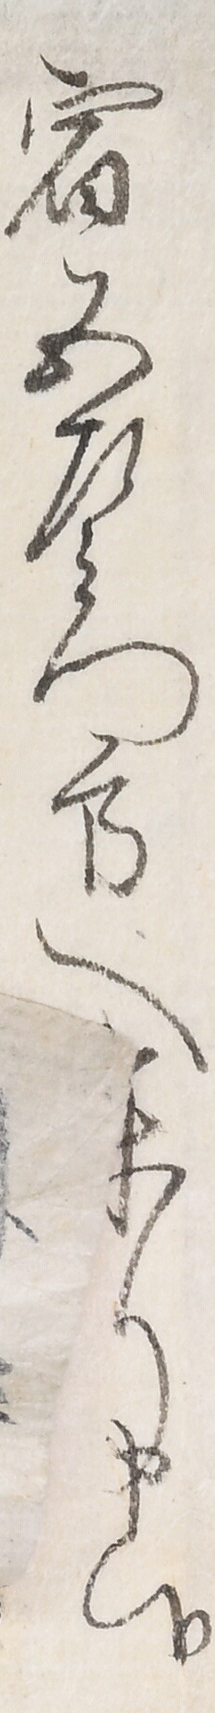宿五左衛門方へ参り申候
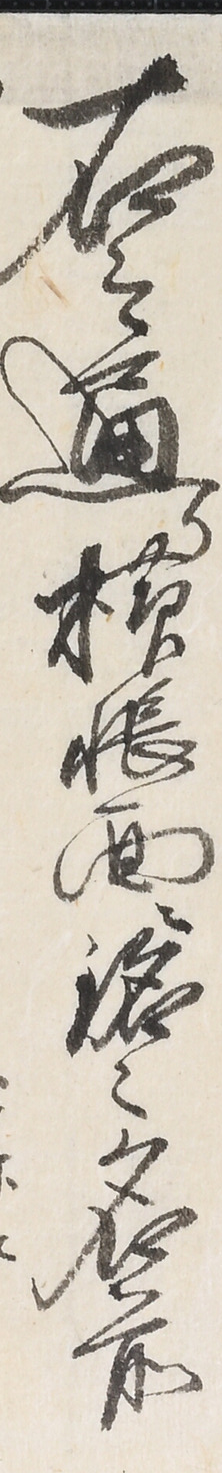右之通り横帳面ニ銘々名前
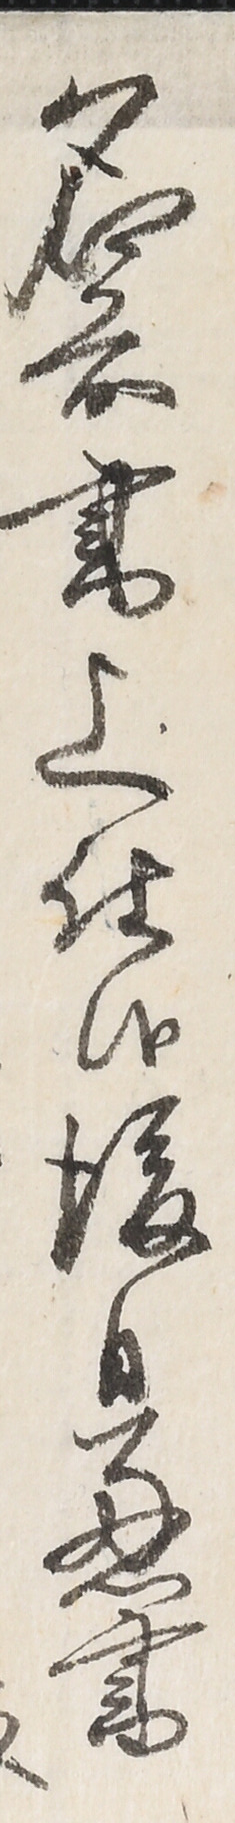名前書上仕候後日慮書
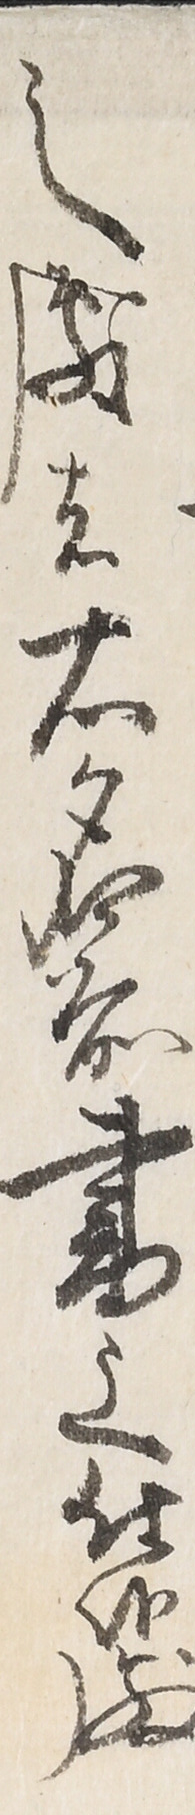之儀は右名前書上仕候処
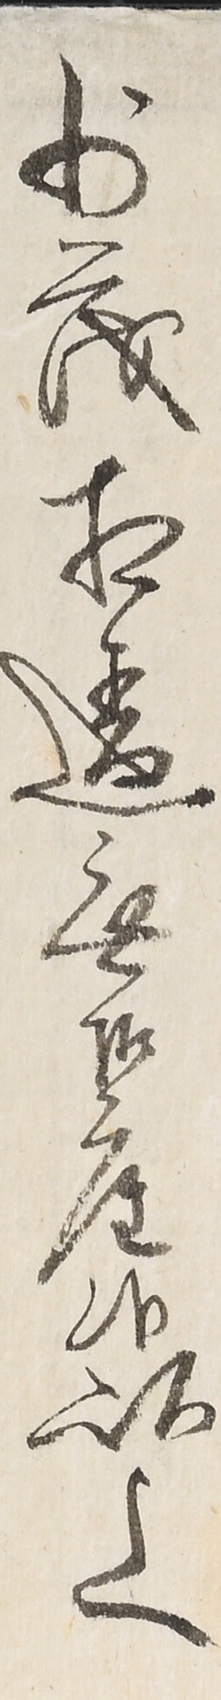少も相違無御座候以上
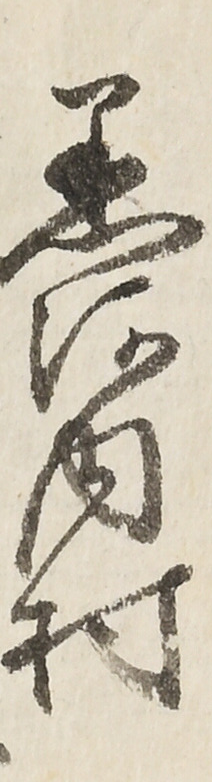黒河内村
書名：安政七庚申年正月石切名前書上帳
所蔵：伊那市立高遠町図書館・合同会社AMANE
